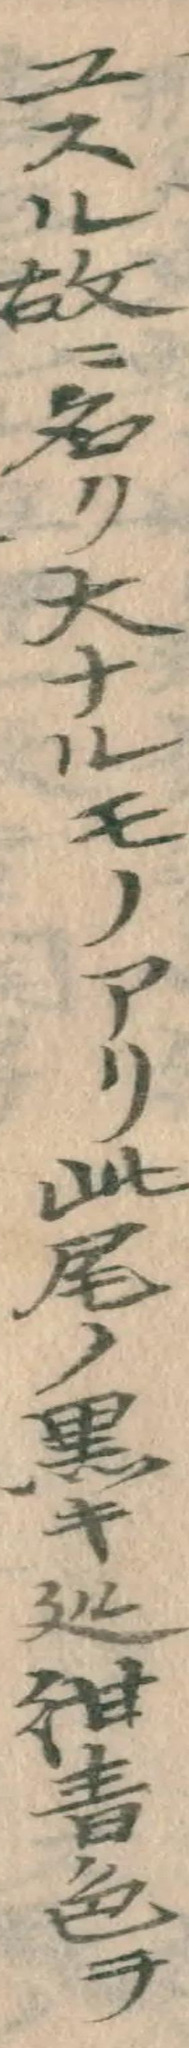ユスル故ニ名ク大ナルモノアリ此尾ノ黒キ処紺青色ヲ
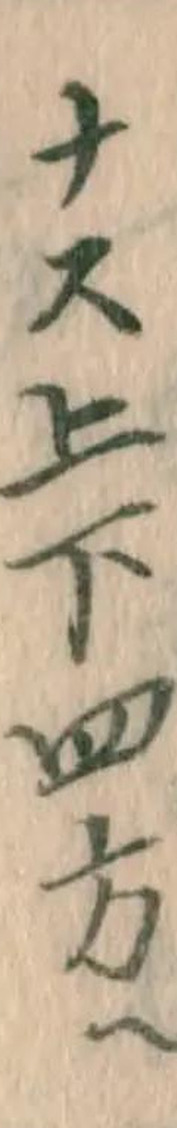ナス上下四方ヘ
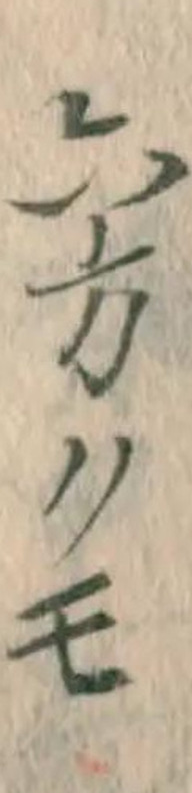六方クモ
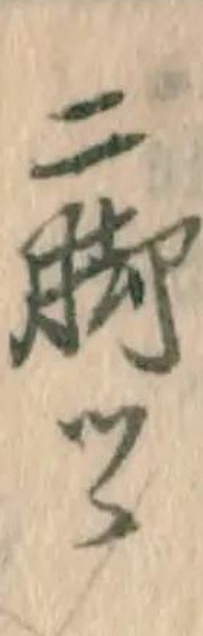二脚ツヽ
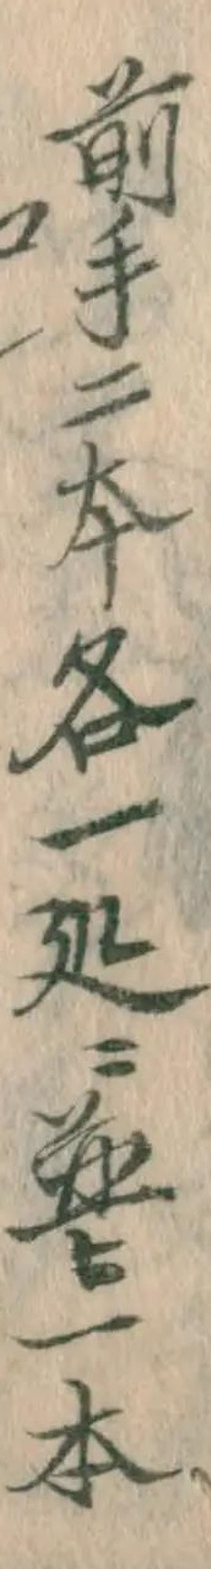前手二本各一処ニ並ヒ一本
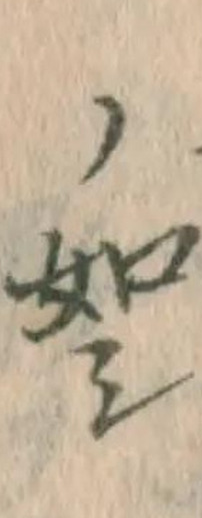ノ如シ
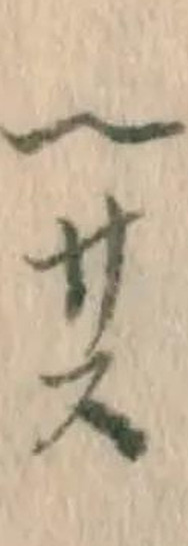ヘサス
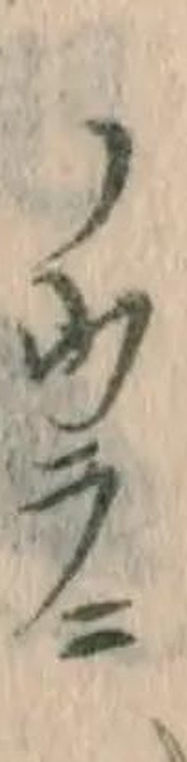ノウラニ
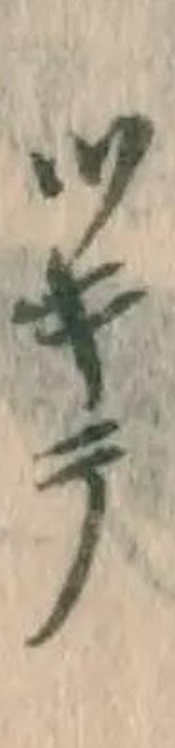ツキテ
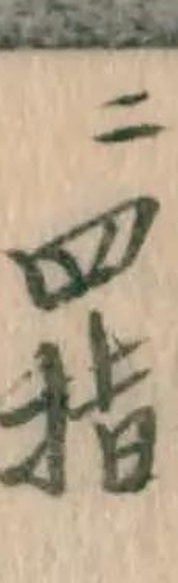ニ四指
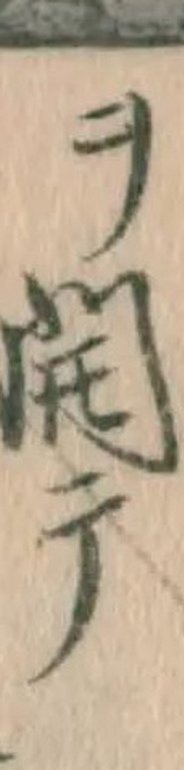ヲ開テ
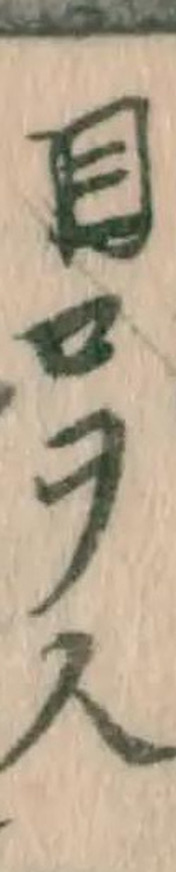目口ヲ人
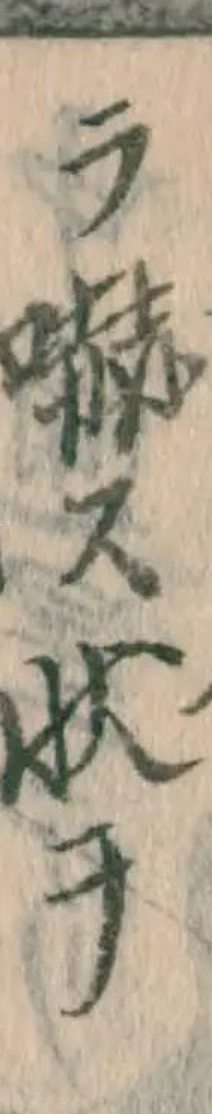ヲ嚇ス状ヲ
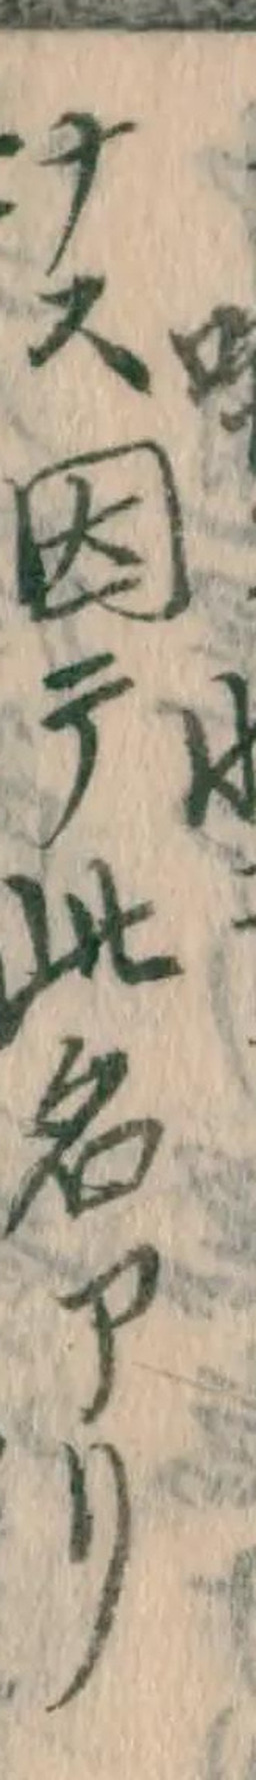ナス因テ此名アリ
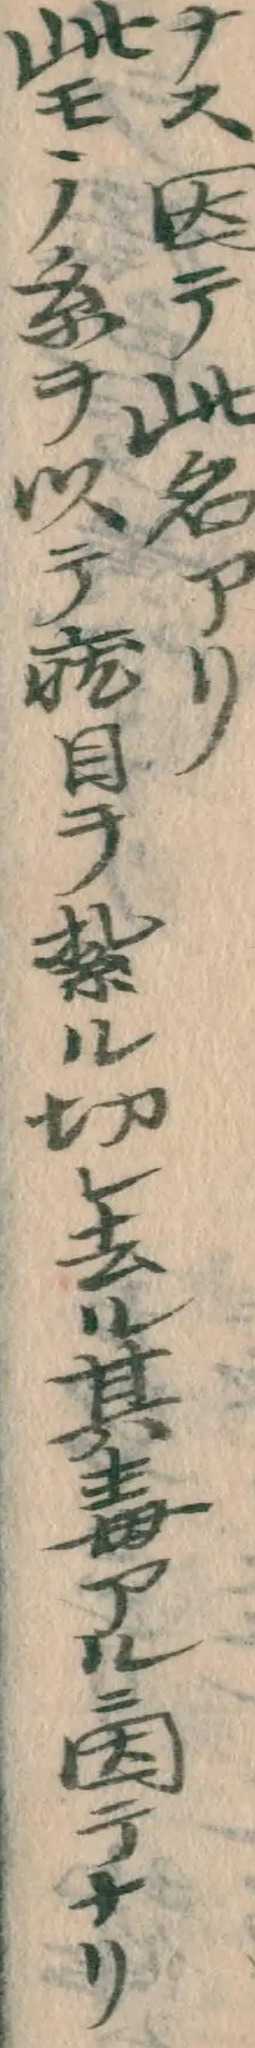此モヽノ糸ヲ以テ疣目ヲ紮ル切レ去ル其毒アルニ因テナリ
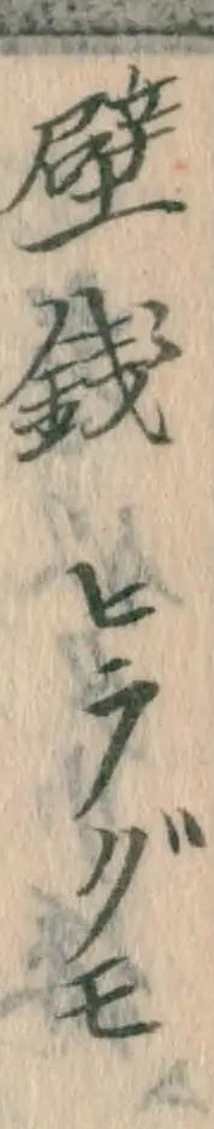壁銭ヒラグモ
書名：千蟲譜 3巻. [2]
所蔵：国立国会図書館 National Diet Library, JAPAN
